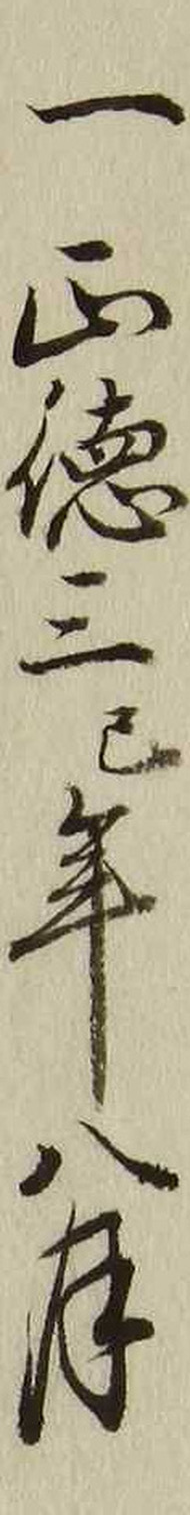一正徳三巳年八月
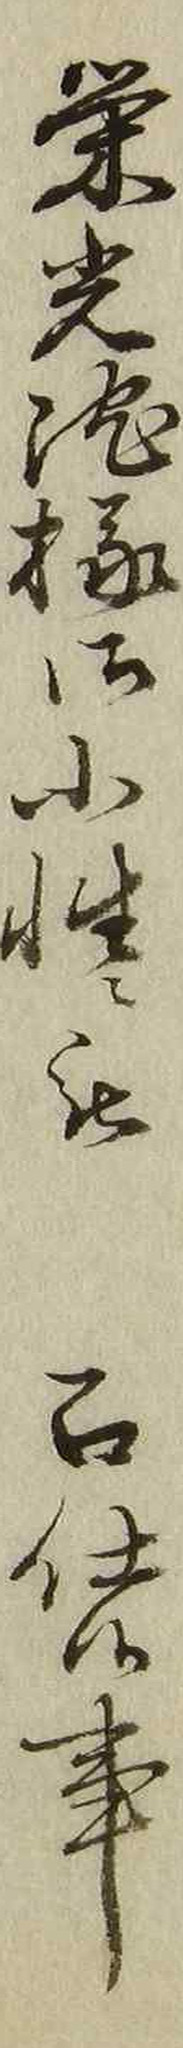栄光院様御小性ニ被召仕候事
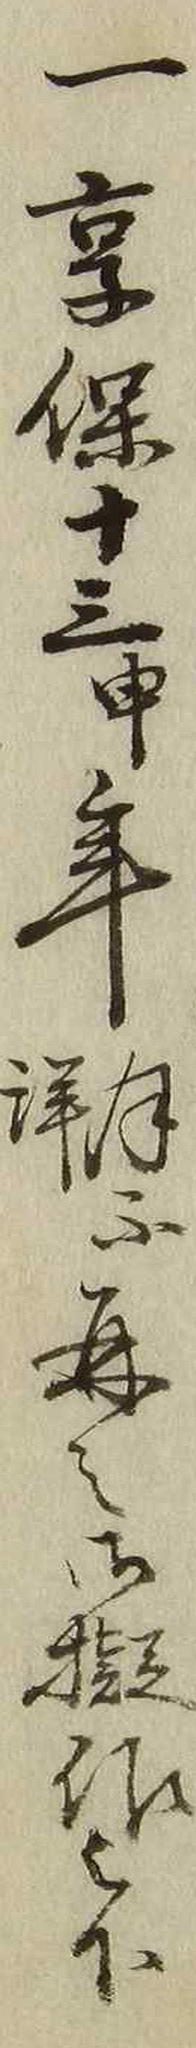一享保十三申年月不詳再之御擬作被下
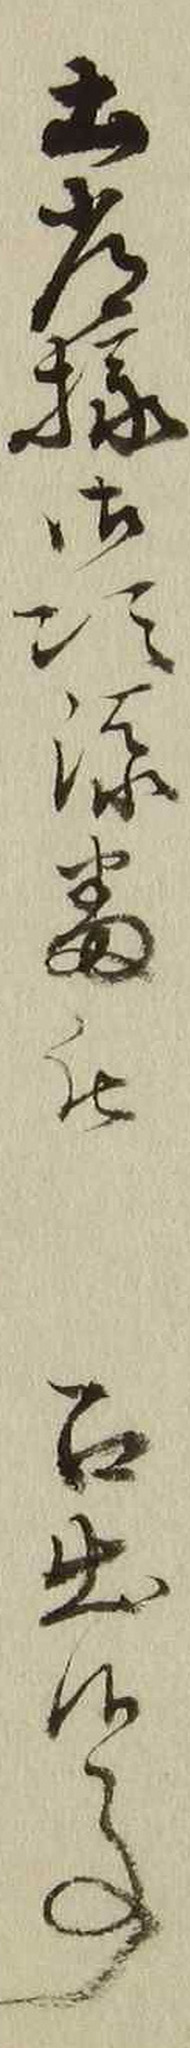土常様御次添番被召出候事
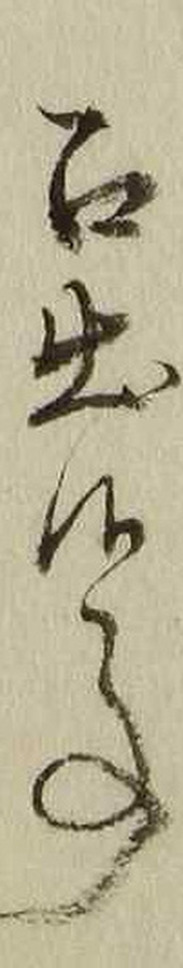召出候事
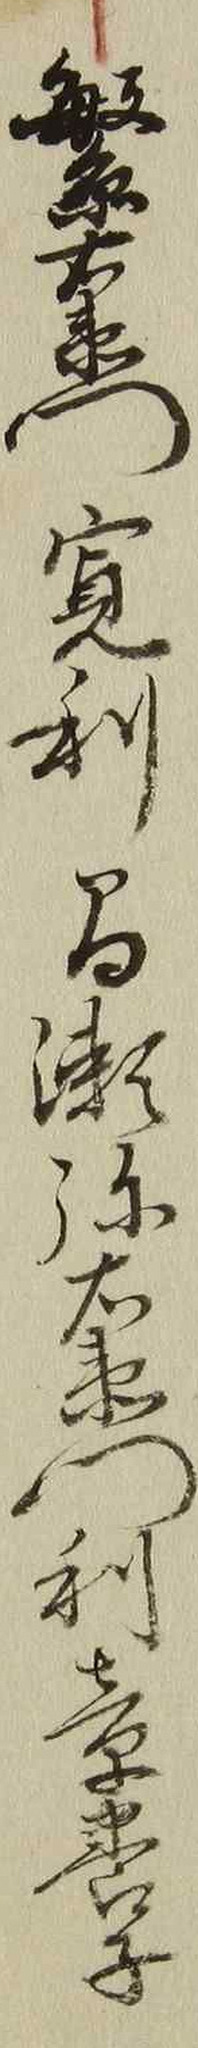繁右衛門寛利間瀬弥右衛門利章養子
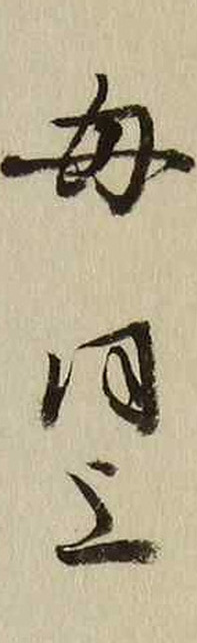母同上
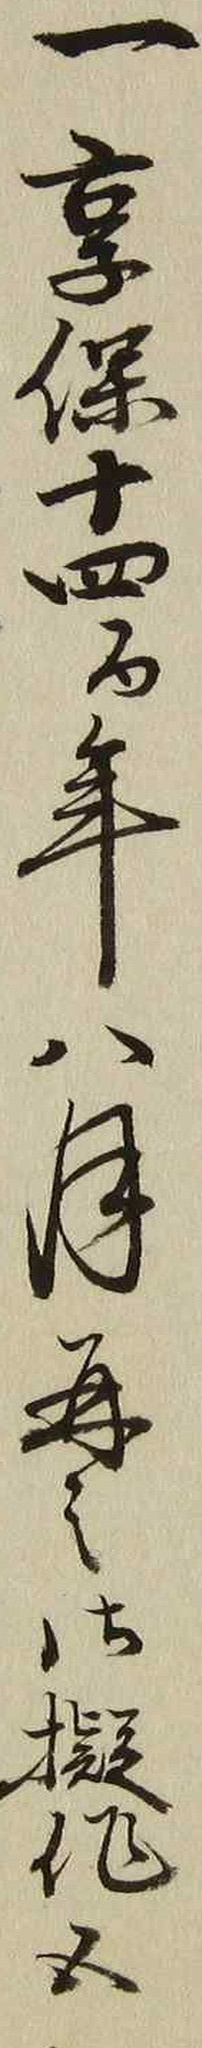一享保十四酉年八月再之御擬作五
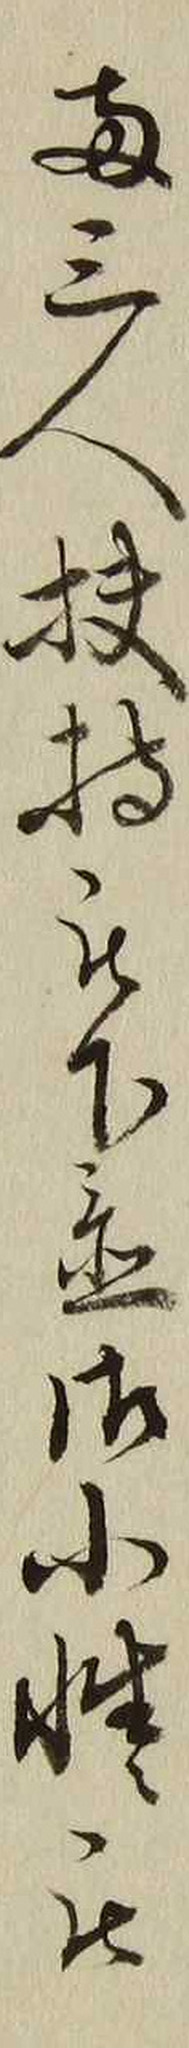両三人扶持被下置御小性ニ被
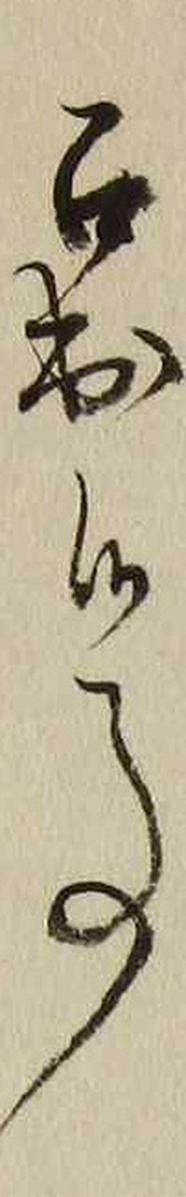召出候事
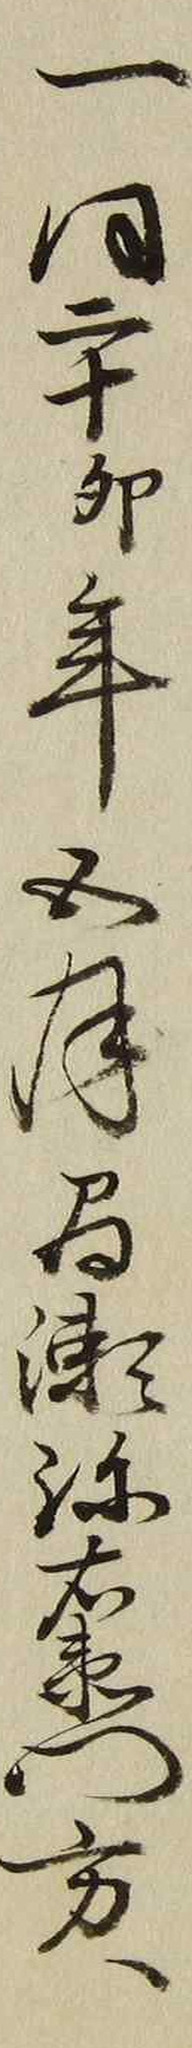一同二十卯年五月間瀬弥右衛門方へ
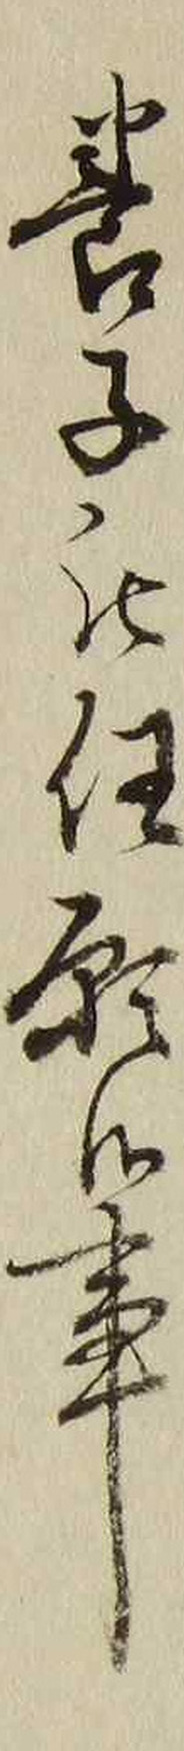養子被任願候事

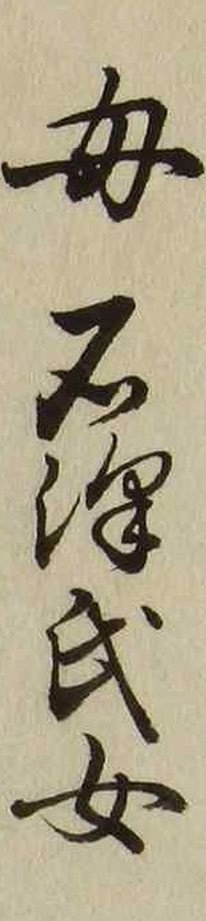母石沢氏女
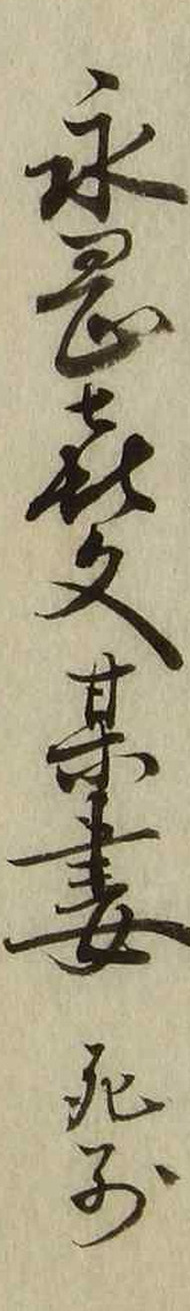女永岡喜文某妻死別
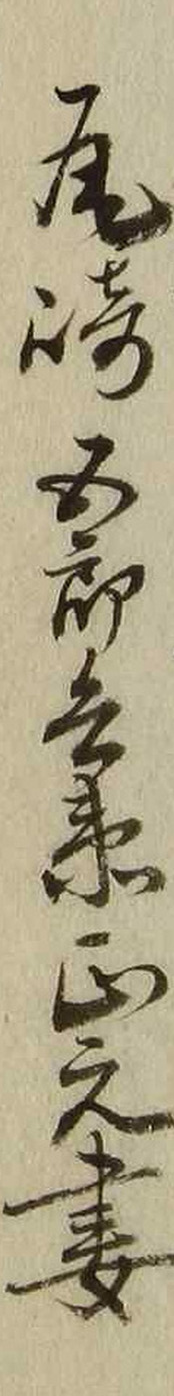瓦崎五郎兵衛正元妻
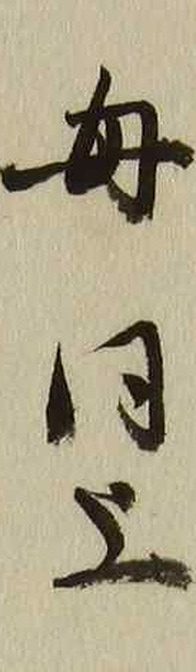母同上
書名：諸士系譜　巻之35　は之部3
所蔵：会津若松市立会津図書館
